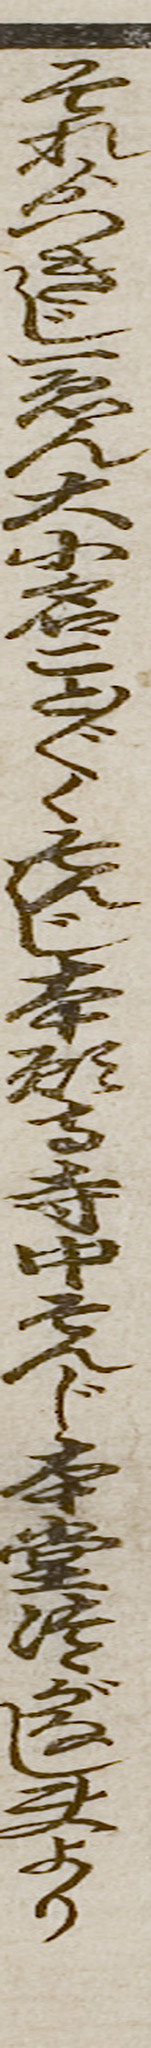それゟつきじ一ゑん大小名こと〴〵くそんじ本願寺寺中そんじ本堂つつがなし夫より
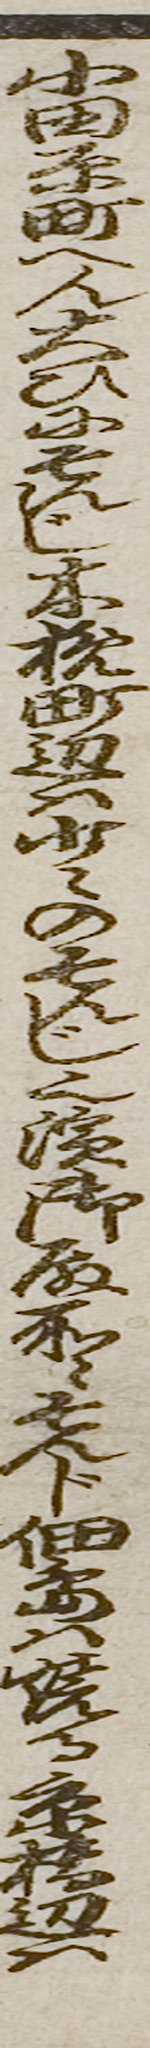小田原町へん大ひにそんじ木挽町辺は少々のそんじ也浜御殿所々そんじ佃島は焼る京橋辺は
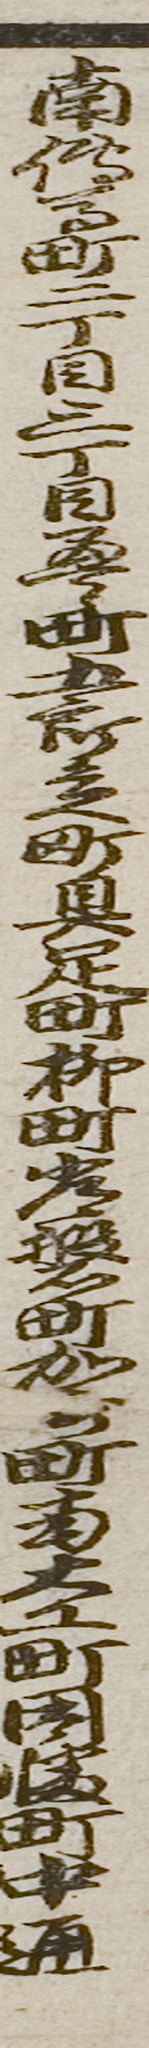南傳馬町二丁目三丁目疊町五郎兵へ町具足町柳町常磐町かが町南大工町因幡町中通
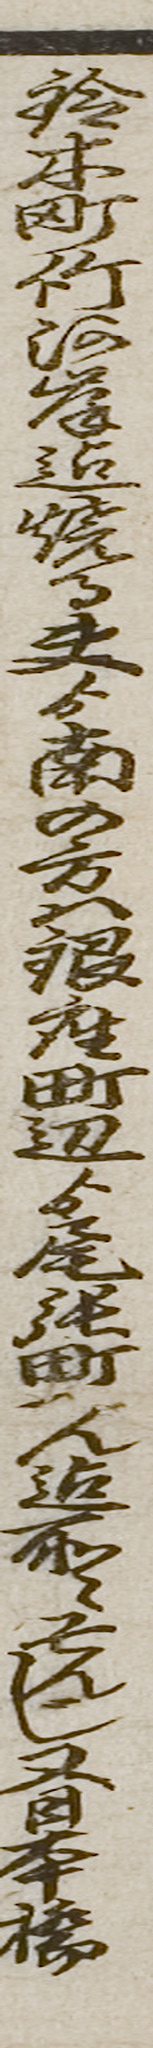鈴木町竹河岸迄燃る夫ゟ南の方は銀座町辺ゟ尾張町へん迄所々そんじ又日本橋
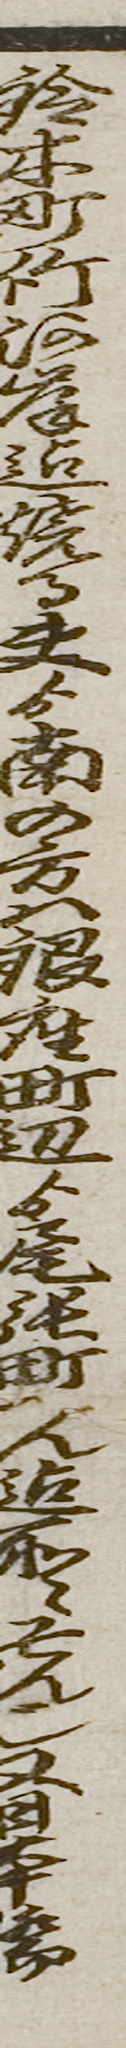鈴木町竹河岸迄燃る夫ゟ南の方は銀座町辺ゟ尾張町へん迄所々そんじ又日本橋
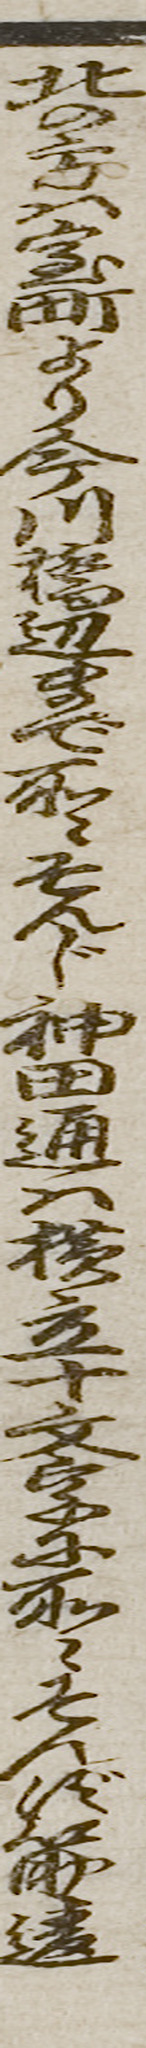北の方は室町より今川橋辺まで所々そんじ神田通は横立十文字に所々そんず筋違

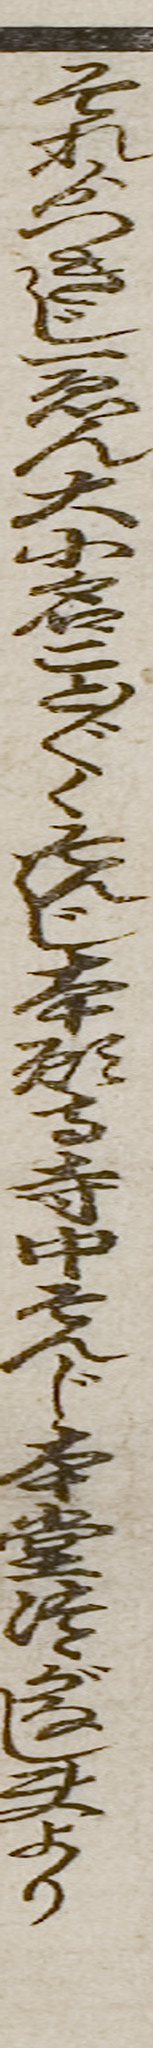それよりつきじ一ゑん大小名ことごとくそんじ本願寺寺中そんじ本堂つゝがなし夫より
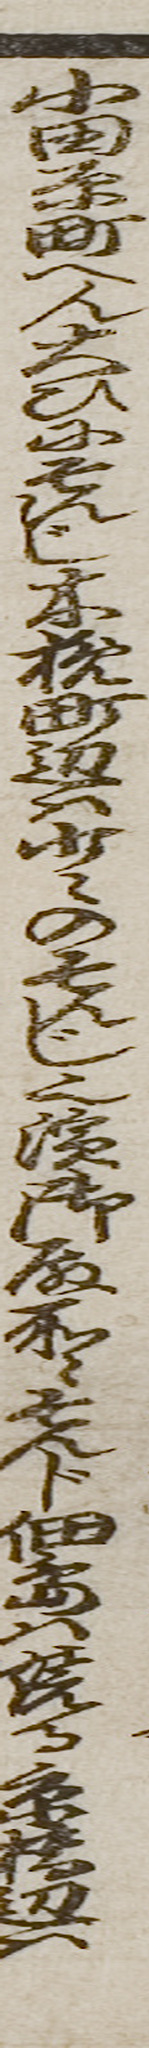小田原町へん大ひにそんじ木挽町辺は少々のそんじ也浜御殿所々そんじ佃島は焼る京橋辺は
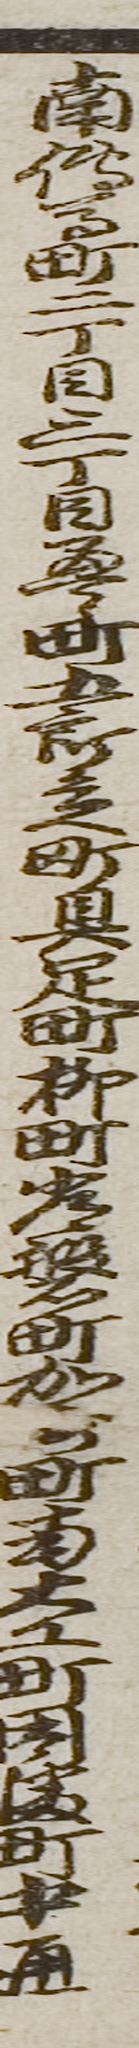南伝馬町二丁目三丁目畳町五郎兵へ町具足町栁町常磐町かが町南大工町因幡町中通
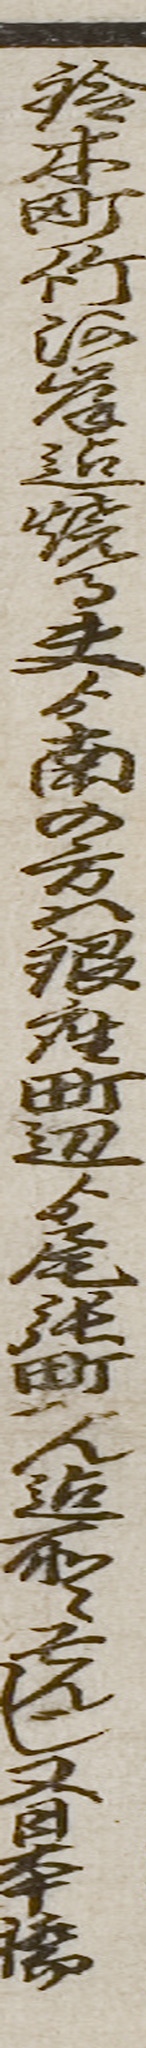鈴木町竹河岸迄焼る夫より南の方は銀座町辺より尾張町へん迄所々そんじ又日本橋
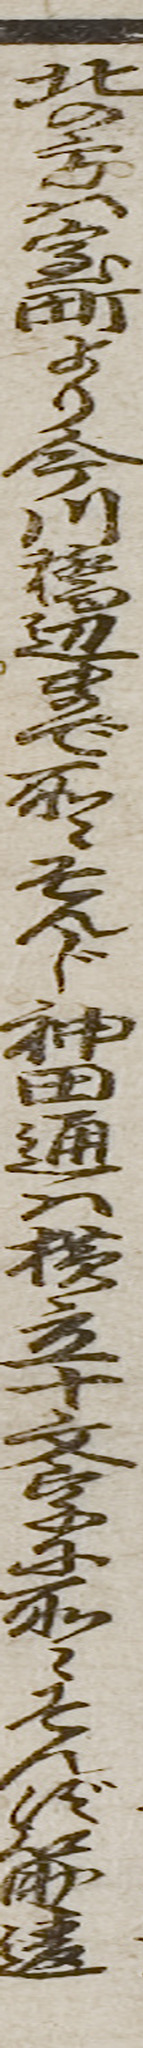北の方は室町より今川橋辺まで所々そんじ神田通は横立十文字に所々そんず筋違
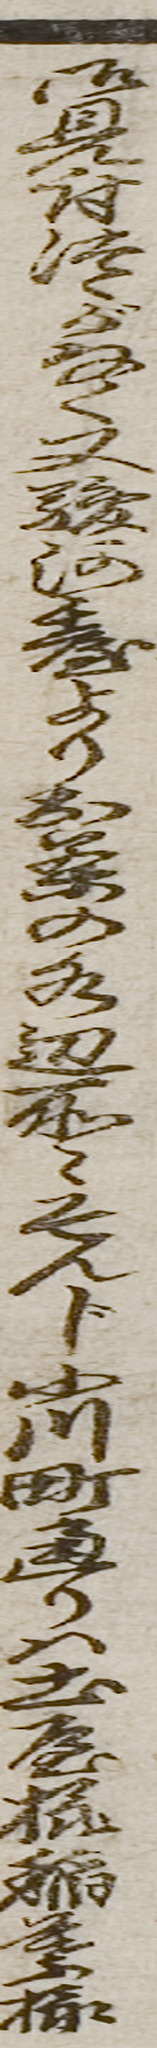御見付つゝがなく又駿河台よりお茶の水辺所々そんじ小川町通りは土屋様稲葉様
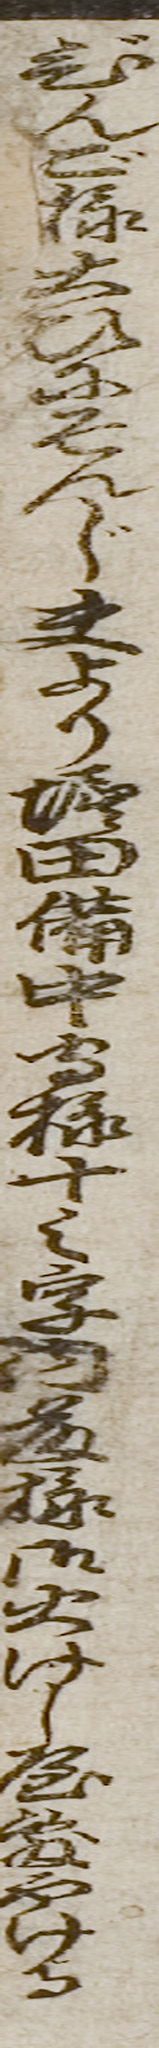びんご様大ひにそんじ夫より堀田備中守様十之字内藤様御火けし屋敷やける
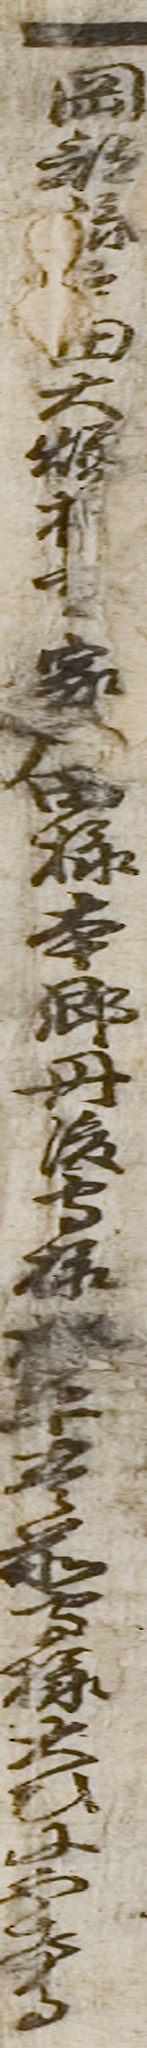岡部様戸田大炊様家戸田様本郷丹後守様松平豊前守様大ひにやける
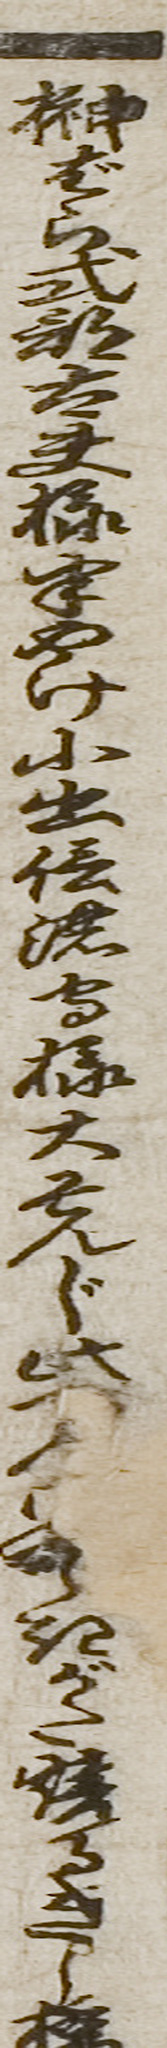榊ばら式部太夫様半やけ小出信濃守様大そんじ此へやしきがた焼るきし橋
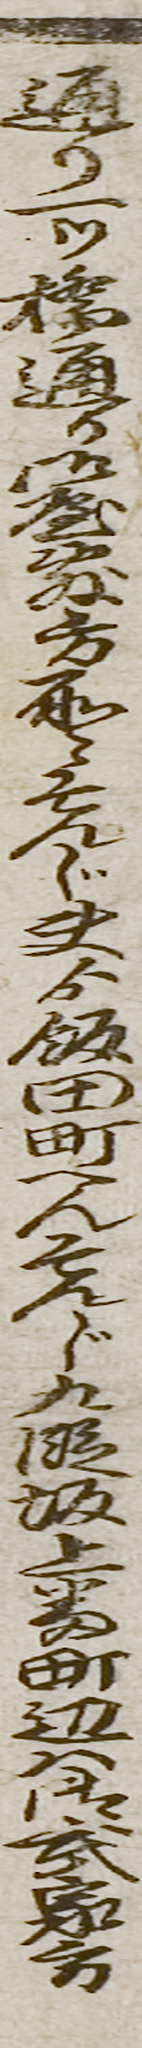通り一つ橋通り御屋敷方所々そんじ夫より飯田町へんそんじ九段坂上番町辺は御武家方
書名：江戸大地震出火場所分
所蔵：東京大学総合図書館 General Library in the University of Tokyo, JAPAN
